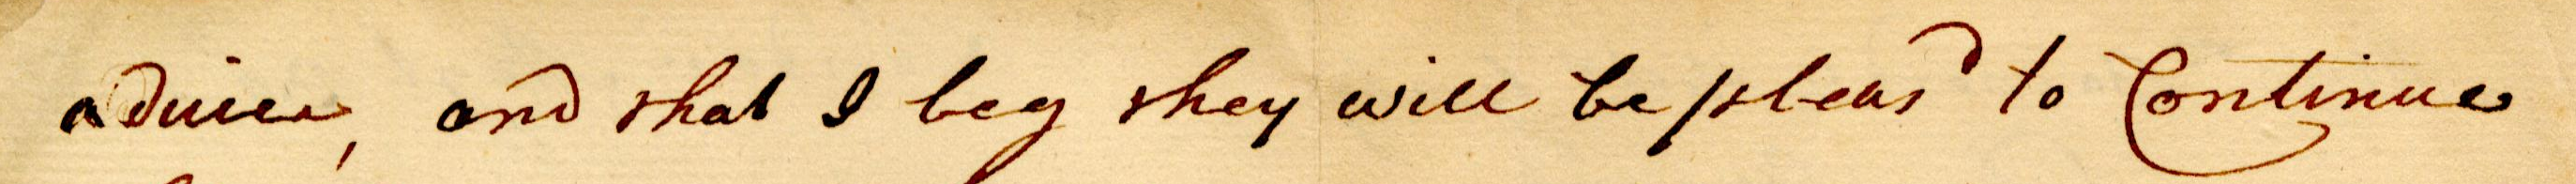advice, and that I beg they will be pleas^d to Continue
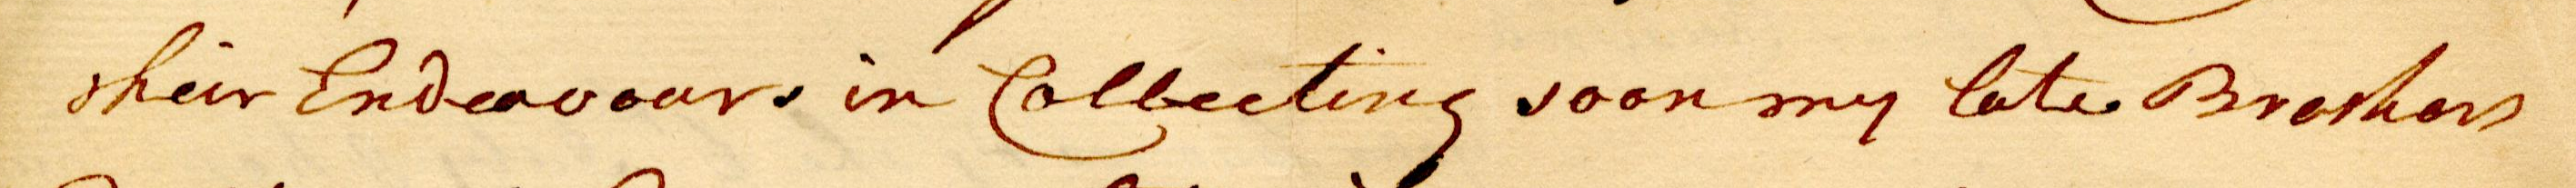their Endeavors in Collecting soon my late Brothers
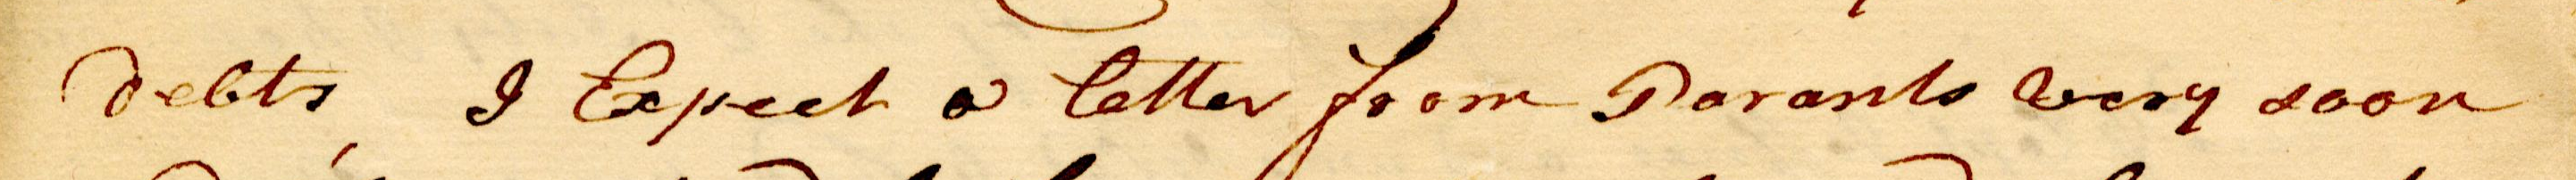debts, I Expect a letter from Parants every soon
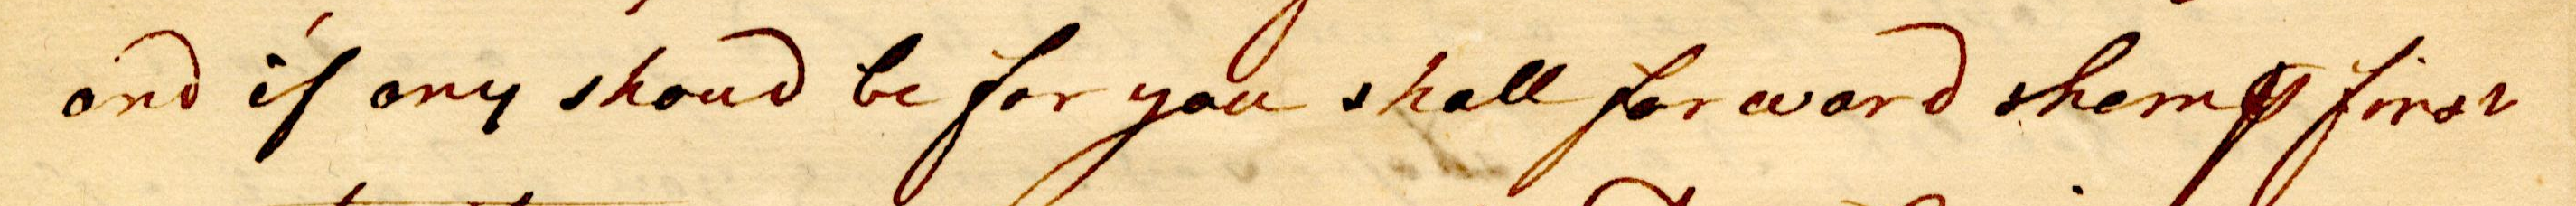and if any shoud be for you shall forward them first
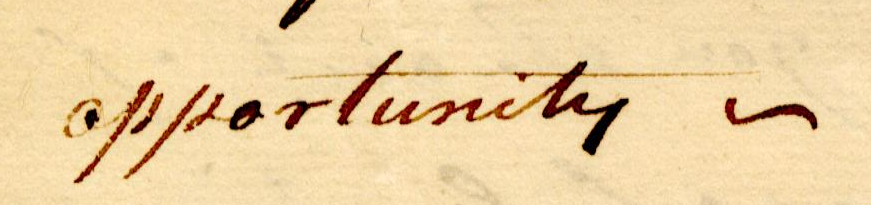opportunity-
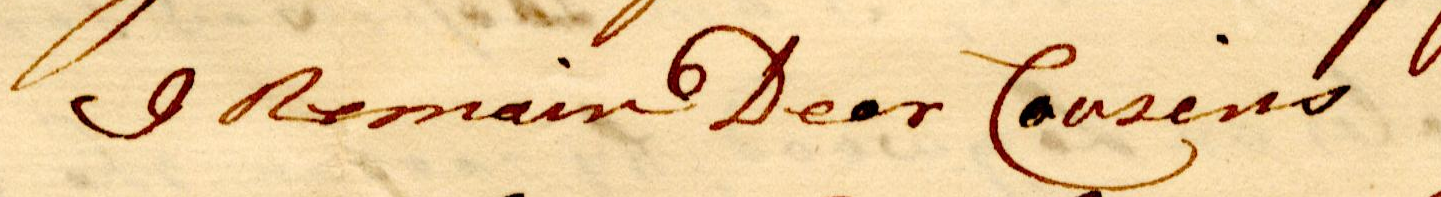I Remain Dear Cousins
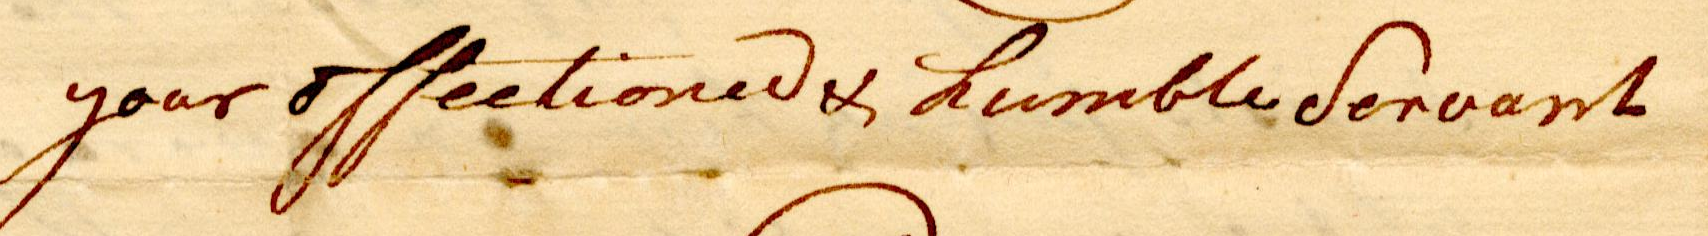your affection & Humble Servant
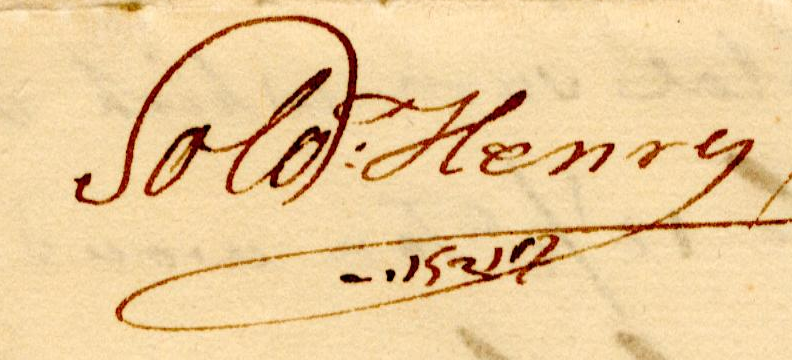Solo^n: Henry
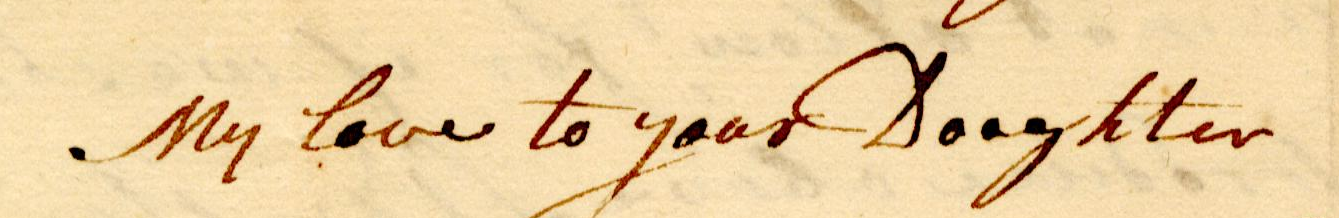My love to your Daughter
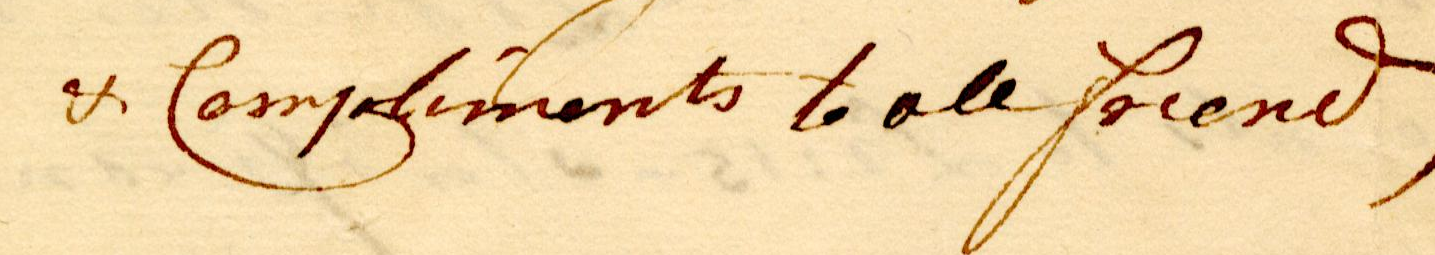& Compliments to all friend
